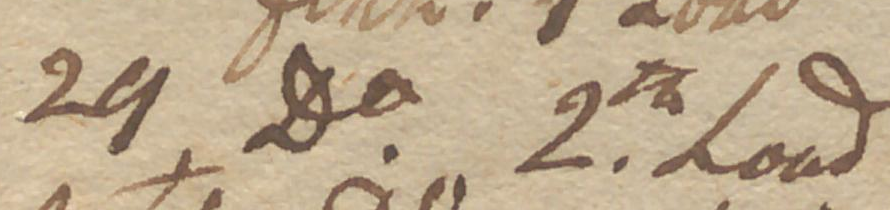29 D^o. 2^th. Load
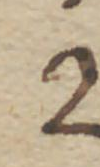2
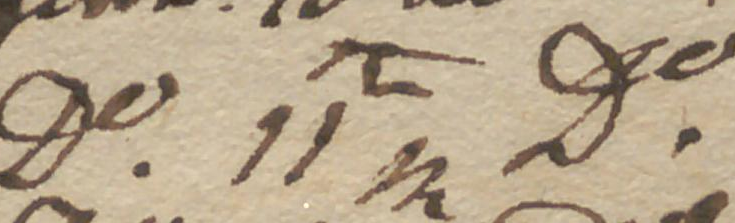D^r. 11^th D^o.
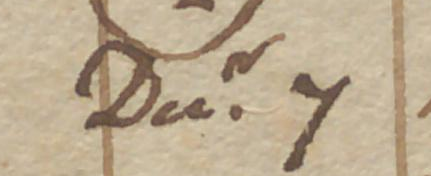Dec^r. 7
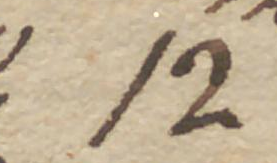12
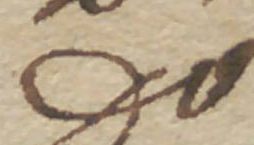D^o.
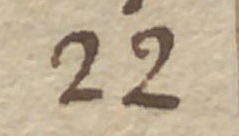22
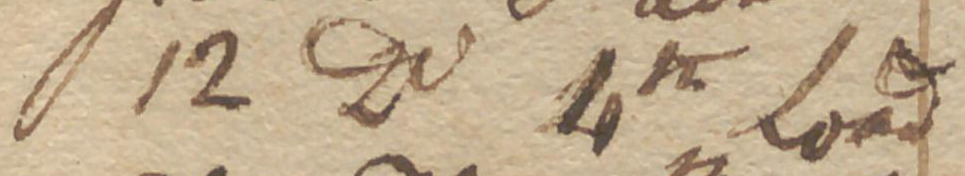12 D^o 4^th Load
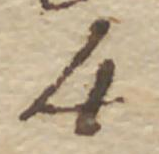4
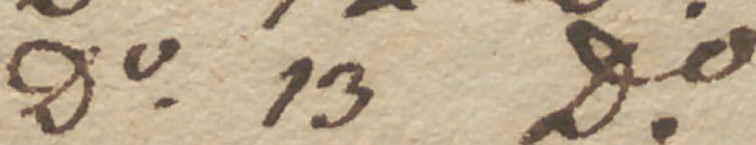D^o. 13 D^o.
